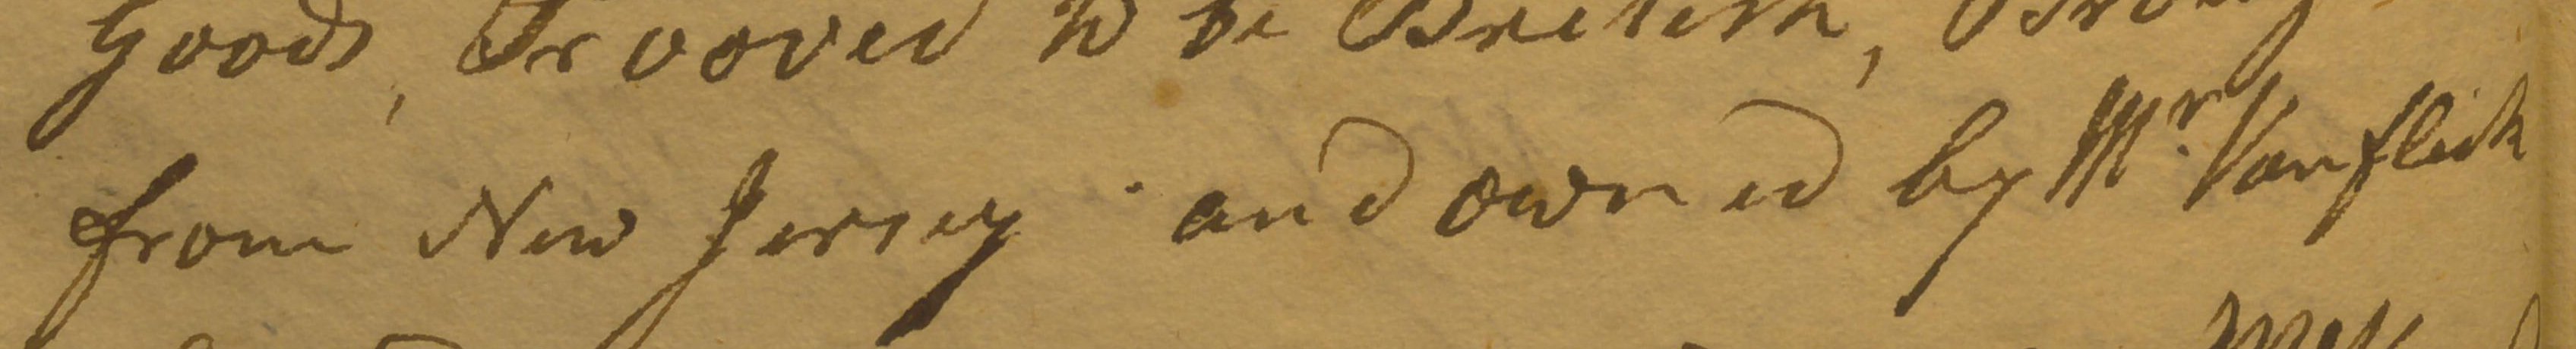from New Jersey and owned by M^r. Vanflick
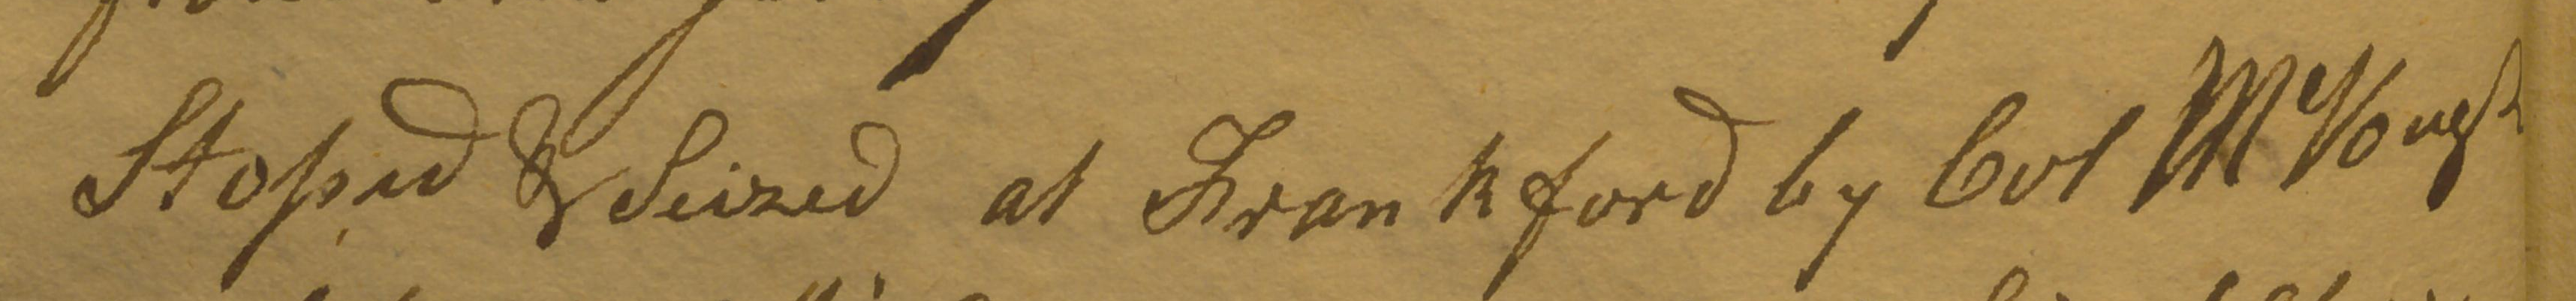Stoped & seized at Frankford by Col M^cVough
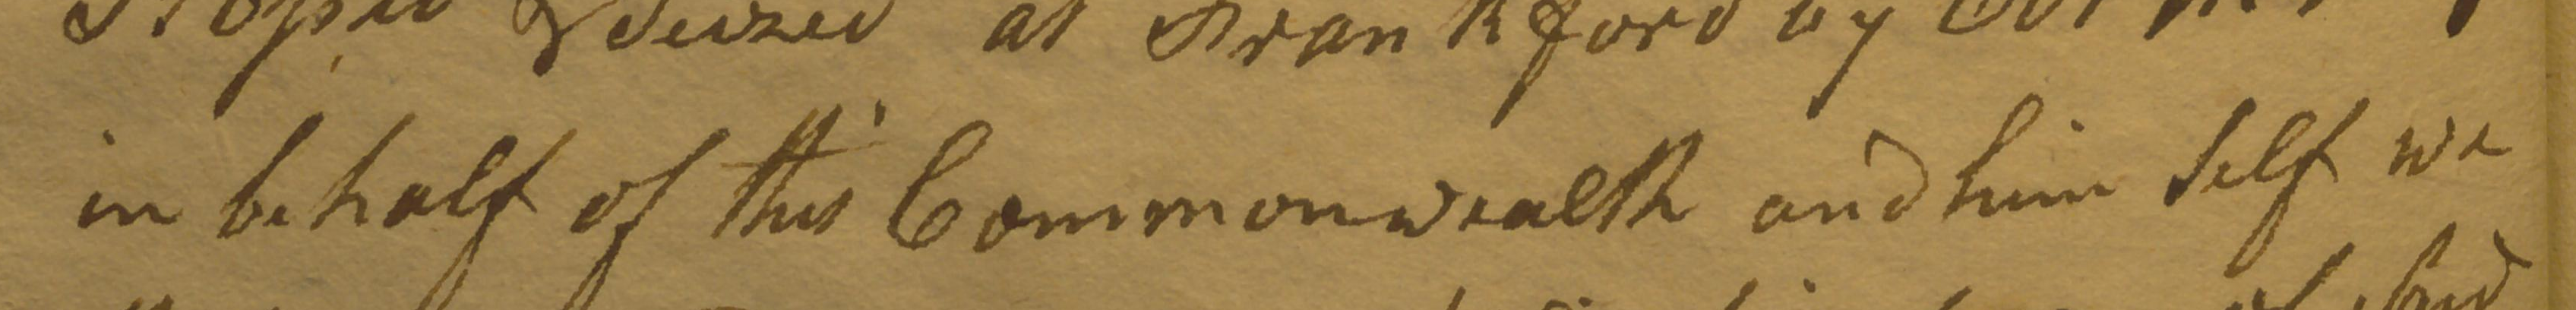in behalf of this Commonwealth and himself we
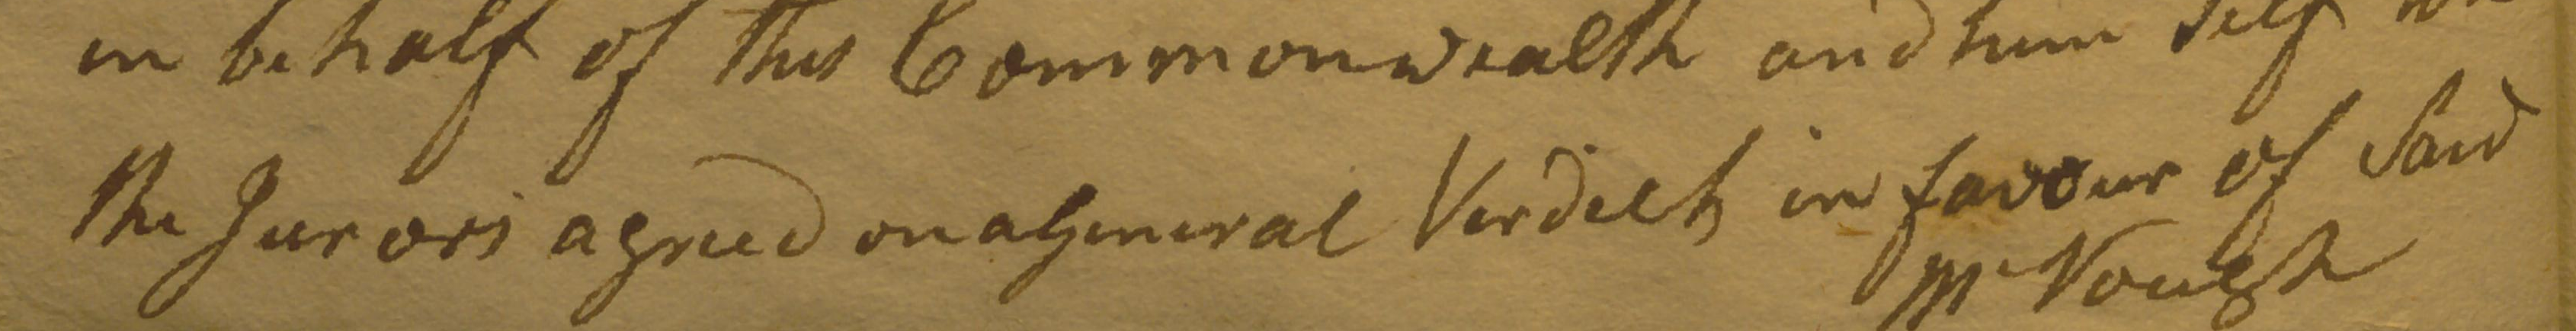the Jurors agred on a General Verdict in favour of Said
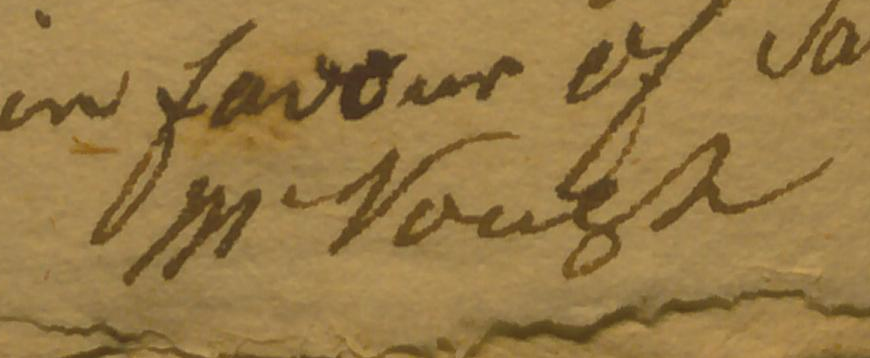M^cVough
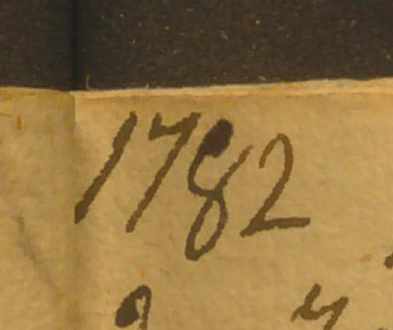1782
